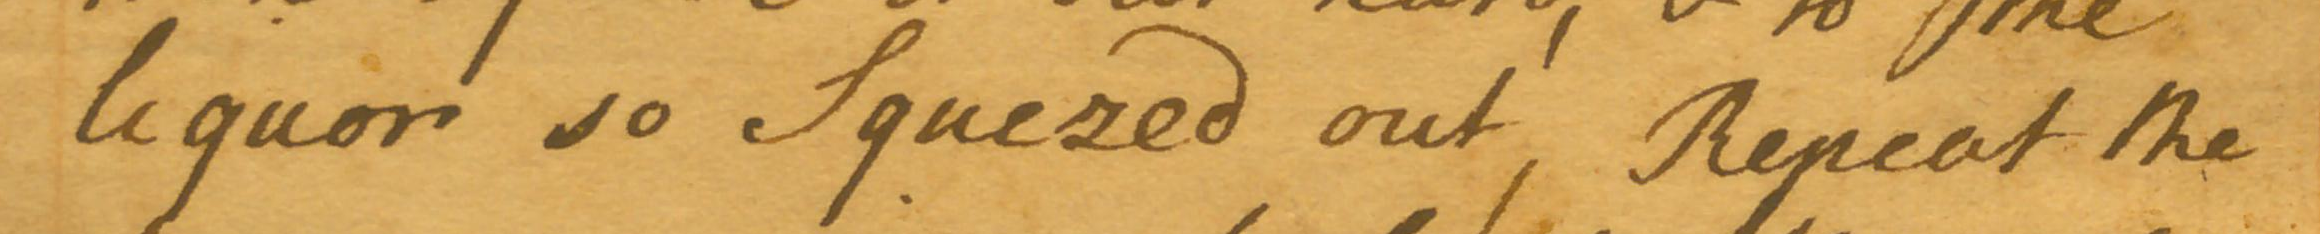liquor so squeezed out, Repeat the
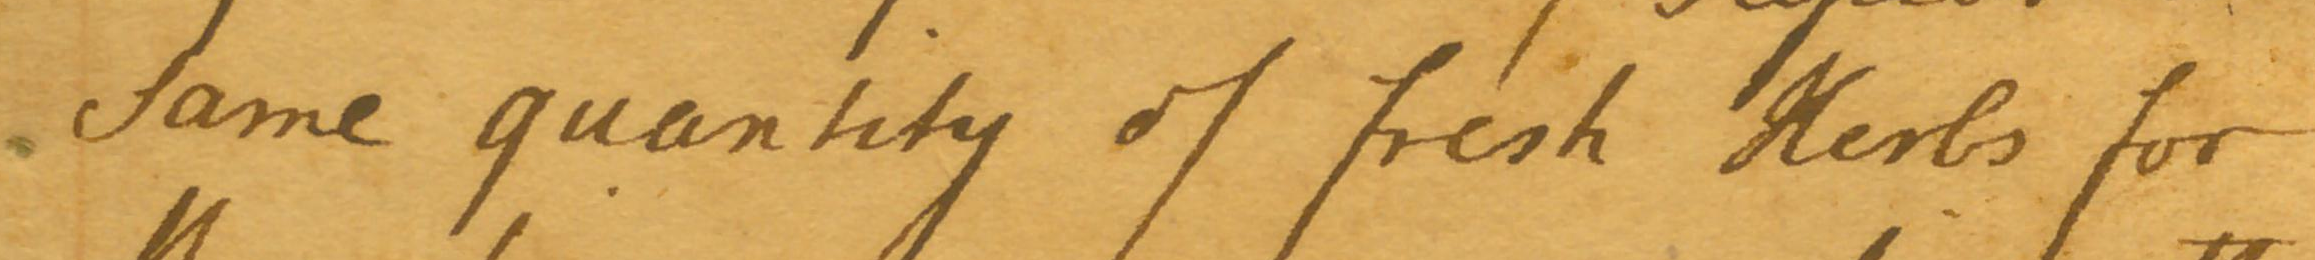some quantity of fresh Herbs for
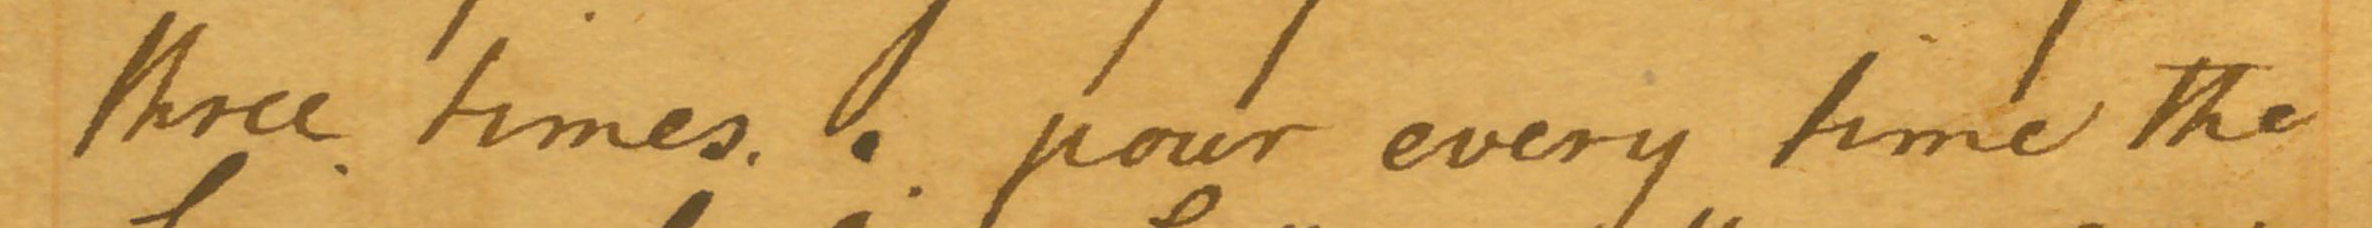three times. pour every time the
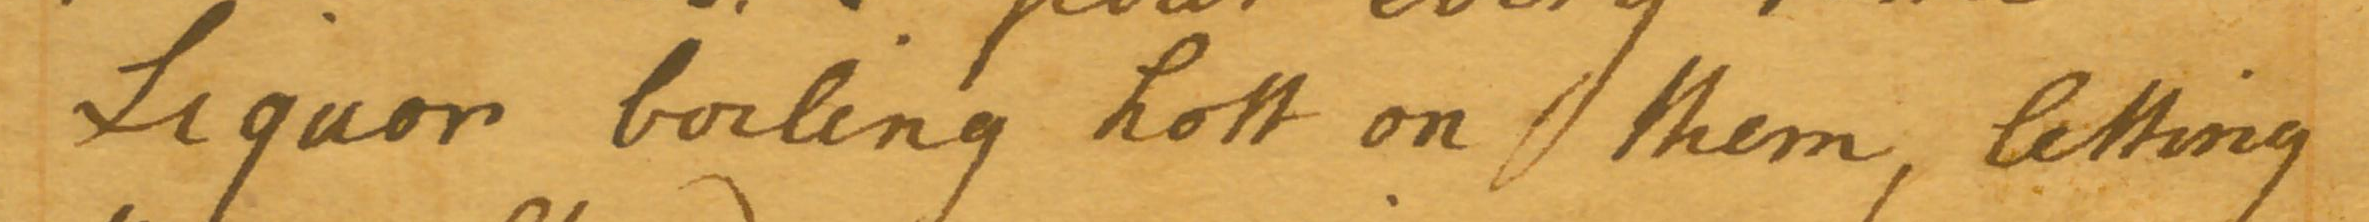Liquor boiling hott on them, letting
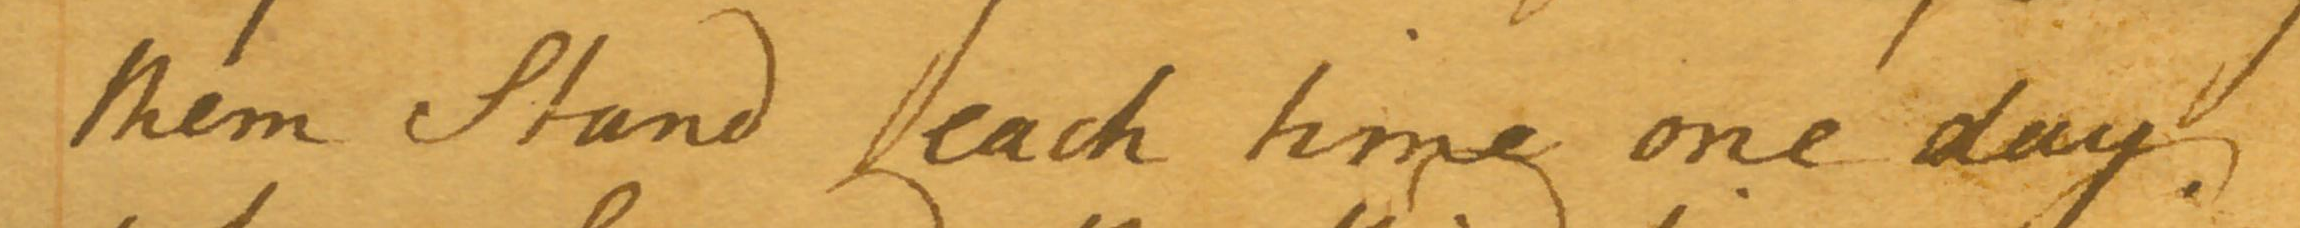them stand each time one day.
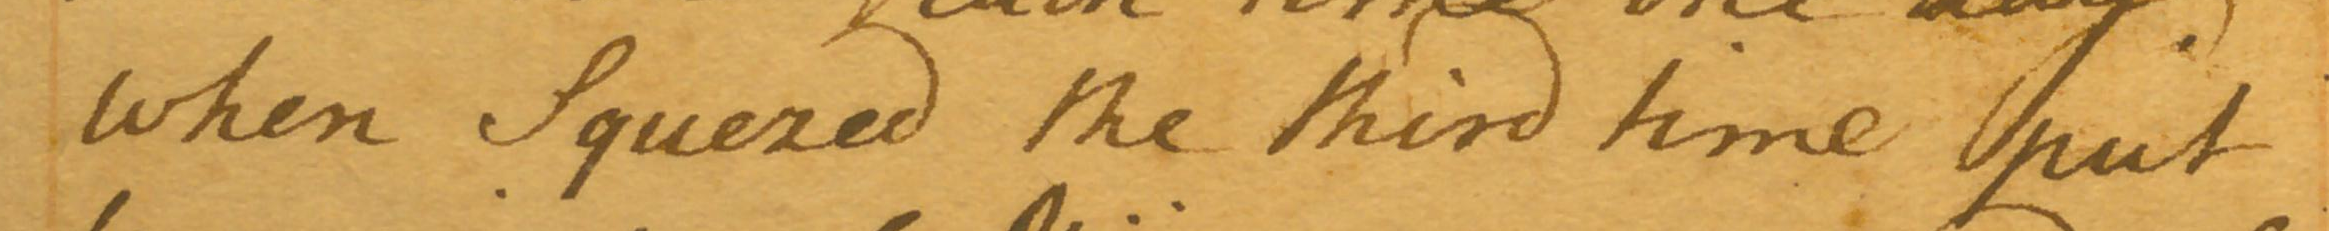when squeezed the third time put
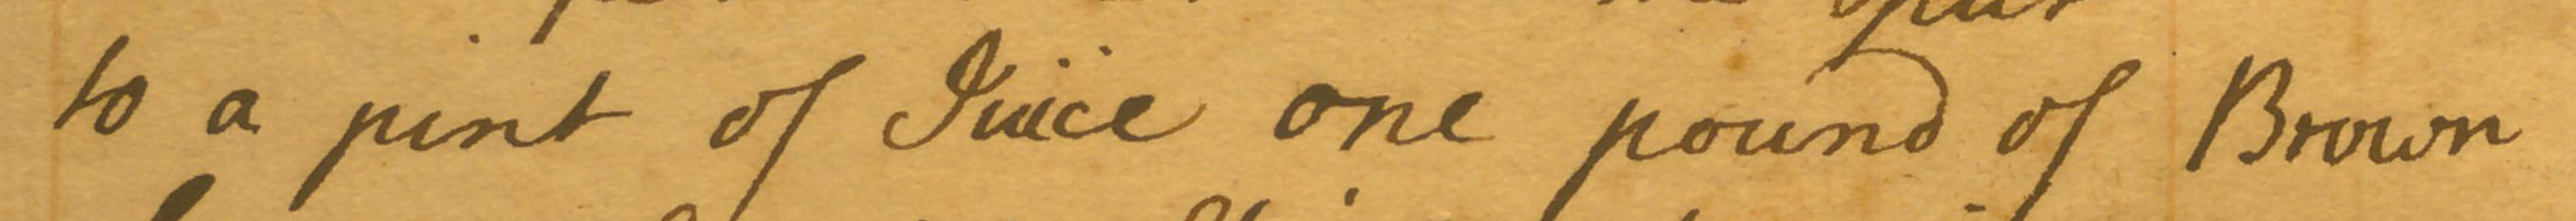to a pint of Juice one pound of Brown
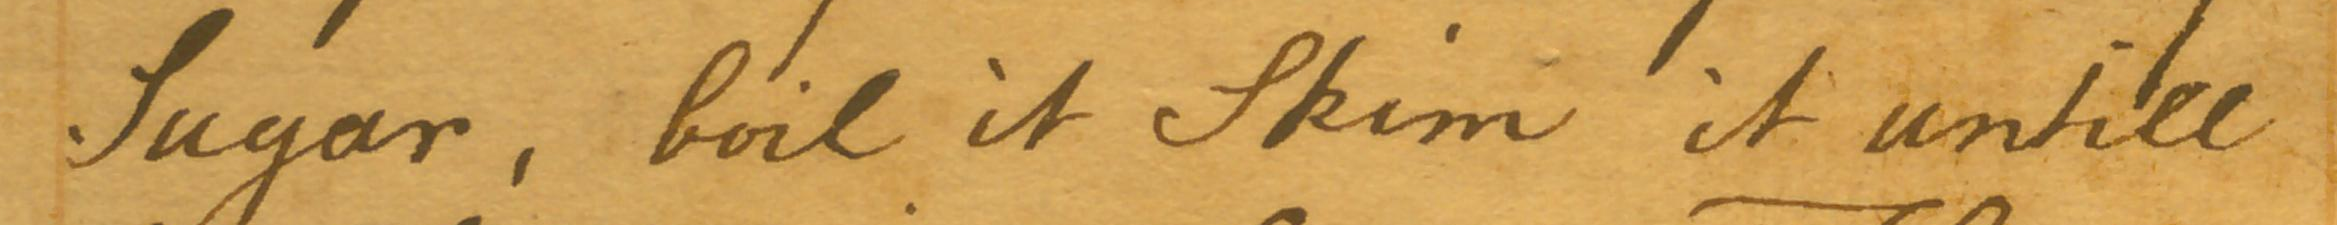Sugar, boil it skim it untill
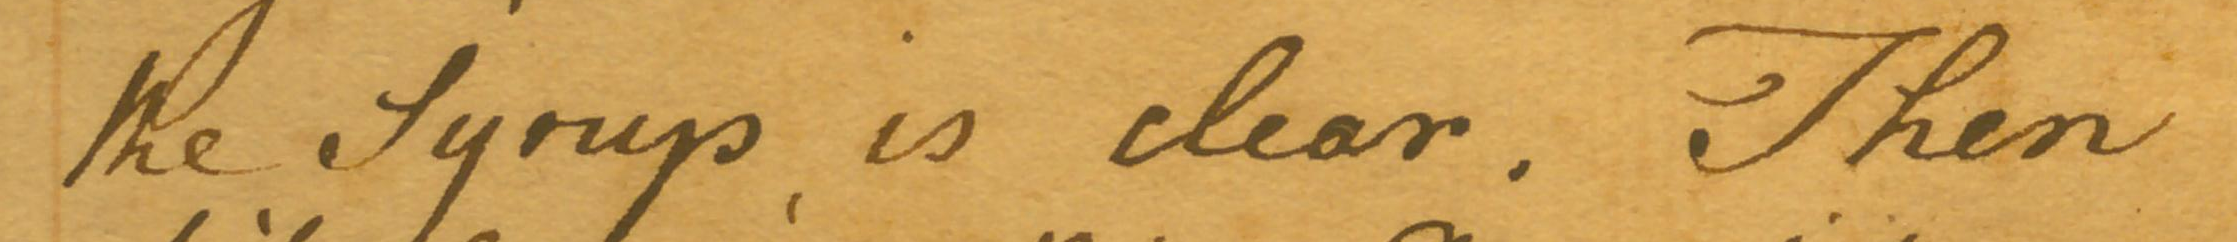the syrup is clear. Then
